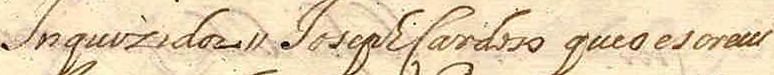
Jnquizidor // Joseph Cardozo que o escreui
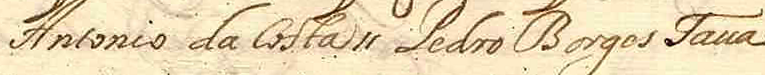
Antonio da Costa // Pedro Borges Taua
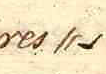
res //
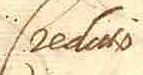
Credito
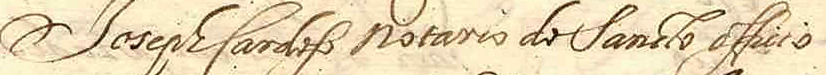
Joseph Cardoso notario do Sancto officio
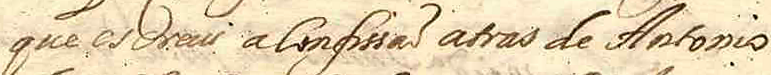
que escreui a Confissaõ atras de Antonio
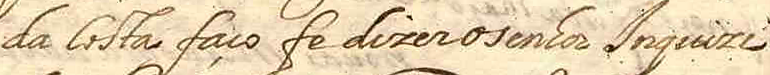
da Costa faço fe dizer o senhor Jnquizi
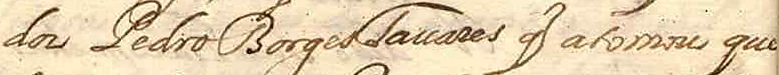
dor Pedro Borges Tauares q̄ a tomou que
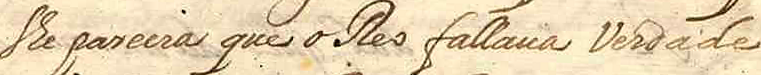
lhe parecia que o Reo fallaua verdade
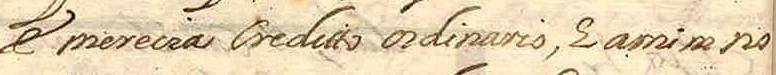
e merecia creditto ordinario, E a mim no
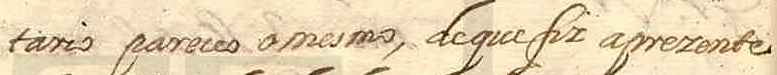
tario pareceo o mesmo, de que fiz a prezente
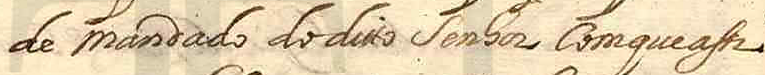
de mandado do ditto Senhor com que assi
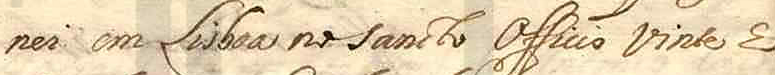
nei em Lisboa no sancto officio vinte E
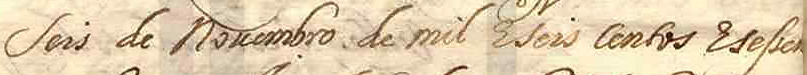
seis de nouembro de mil E seiscentos e sessen
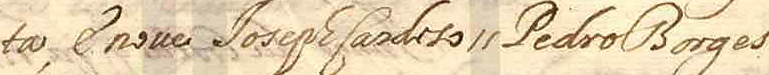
ta, e noue Joseph Cardoso // Pedro Borges
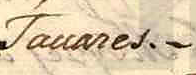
Tauares. -
